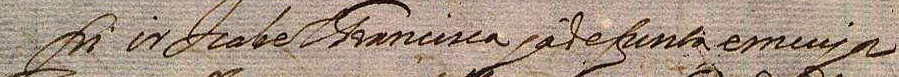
foi ir Izabel Françisca ja defunta, em cuja
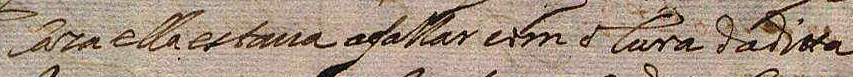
Caza ella estaua a fallar com o Cura da ditta
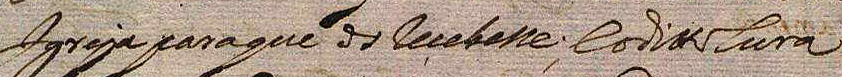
Jgreja para que os Reçebesse; E o ditto Cura
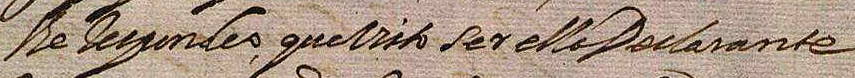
lhe Respondeo, que visto ser ella Declarante
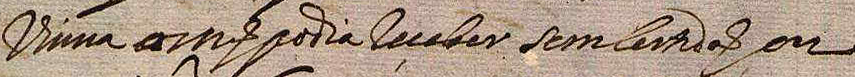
Viuua os naõ podia Reçeber sem Certidaõ, ou
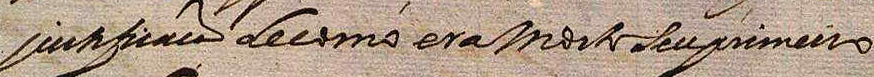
justificaçaõ de como era morto seu primeiro
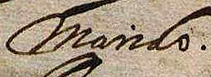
marido.
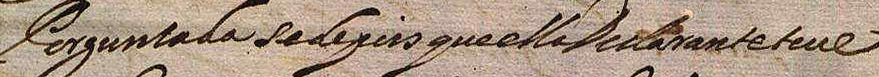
Perguntada se depois que ella Declarante teue
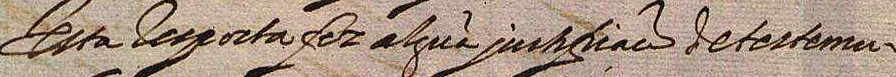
esta resposta fez alguā justificaçaõ de testemu
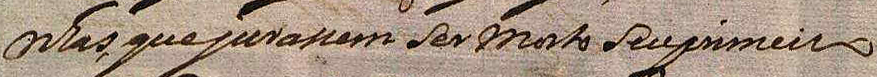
nhas, que jurassem ser morto seu primeiro
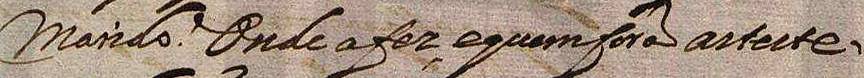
marido? Onde a fez, e quem foraõ as teste
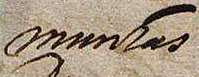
munhas?
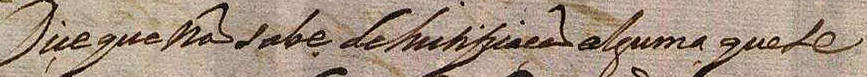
Diçe que naõ sabe de Iustificaçaõ alguma, que se
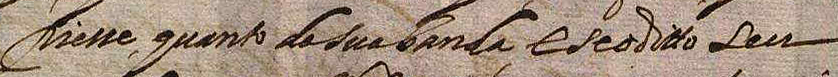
fizesse, quanto da sua banda, e se o ditto seu
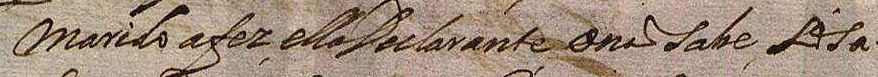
marido a fez, ella Declarante, o naõ sabe, só sa
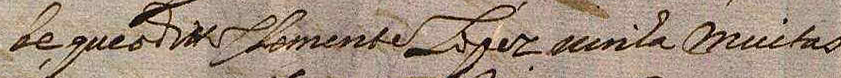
be, que o ditto Clemente Lopez uinha muitas
